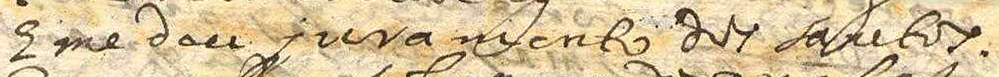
E me deu juramento dos sanctos
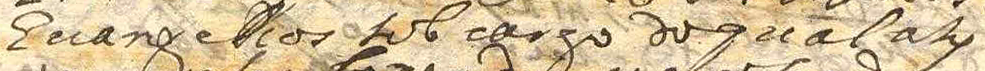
Euangelhos sob cargo do qual asy
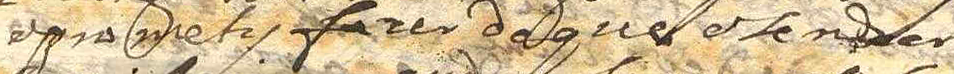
o promety fazer do que o senhor
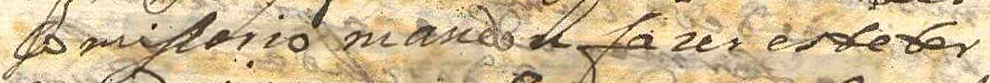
comissario mandou fazer este ter
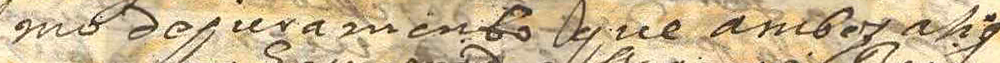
mo de juramento que ambos asig
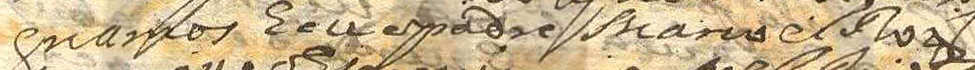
namos E eu o padre Manoel Roiz̄
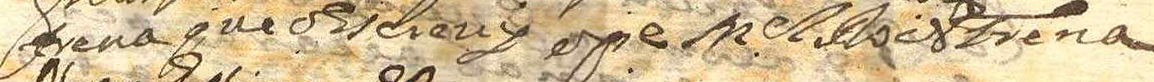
trena que o Escreuj o p.e M.el Rois Trena
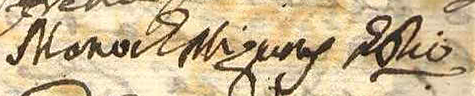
Manoel Miguens d̄ Rio
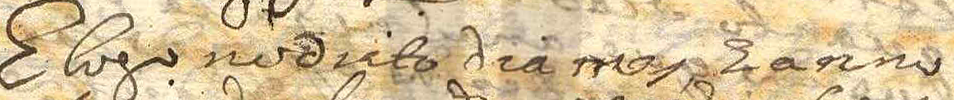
E logo no dicto dia mes E anno
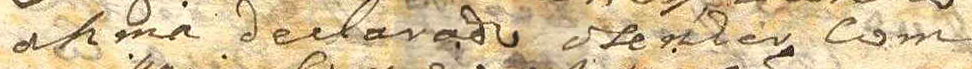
asima declarado o senhor com
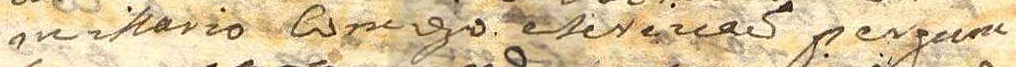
missario comigo escriuaõ pergun
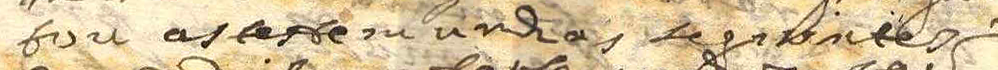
tou as testemunhas seguintes
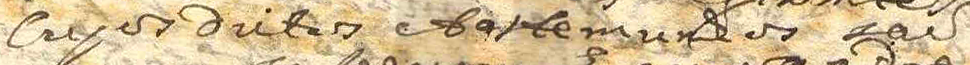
cujos dictos e testemunhos saõ
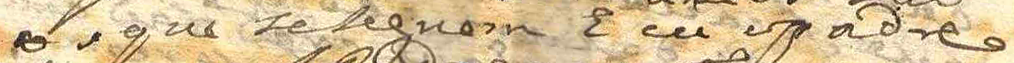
os que se seguem E eu o padre
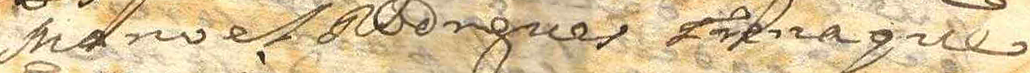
Manoel Rodrigues Trena que
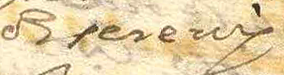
o Escreuy
